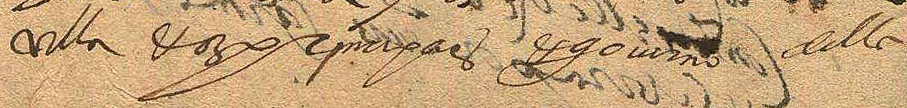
villa & os prjncipaes & gouerno della
